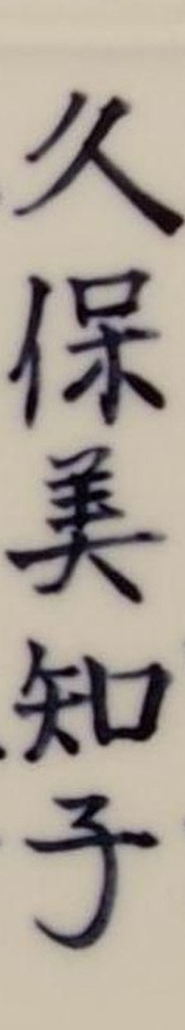久保美知子
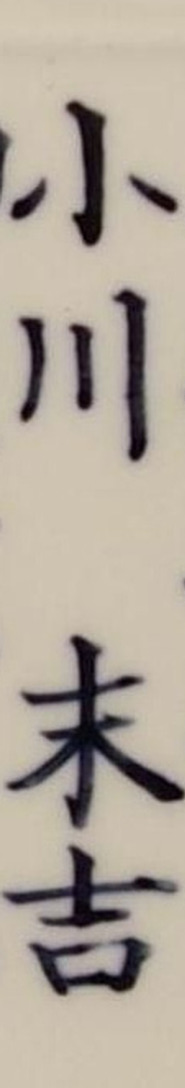小川末吉
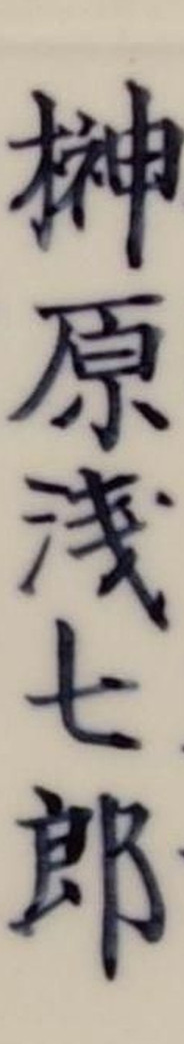榊原浅七郎
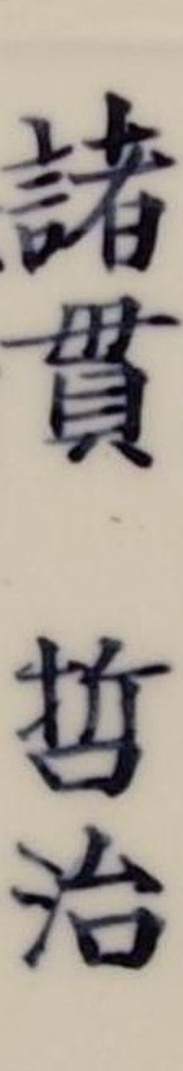諸貫哲治
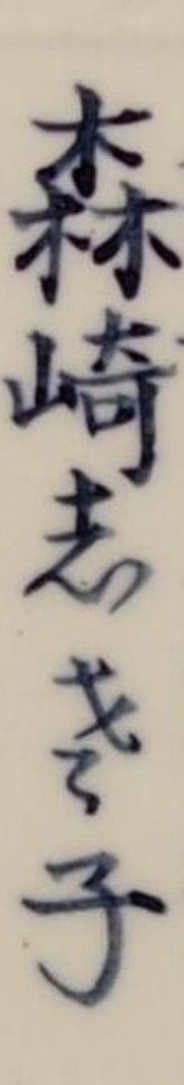森崎しさ子
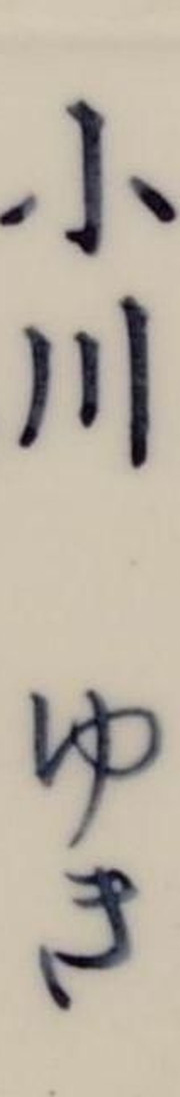小川ゆき
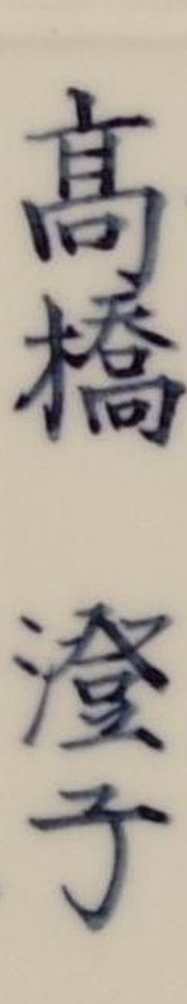高橋澄子
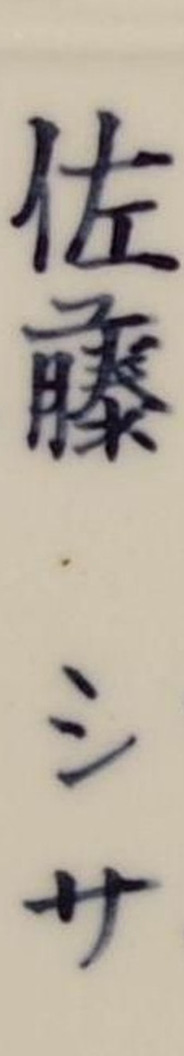佐藤シサ
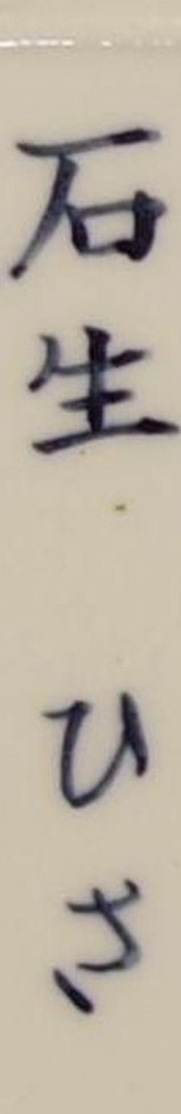石生ひさ
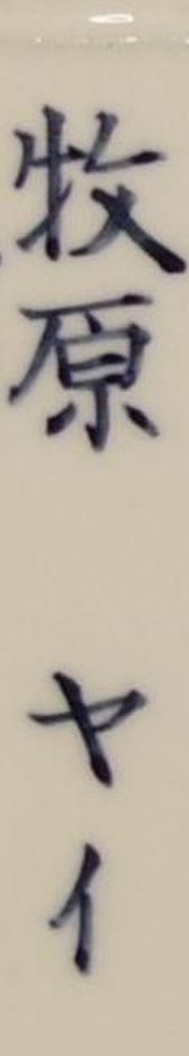牧原ヤイ
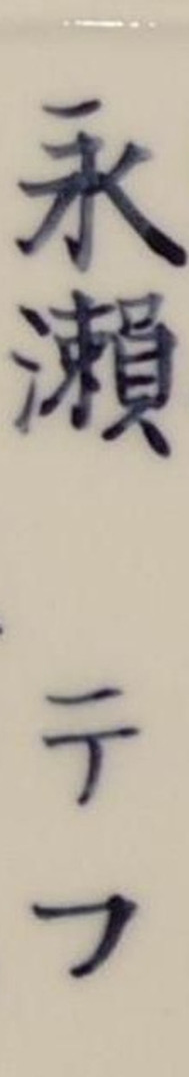永瀬テフ
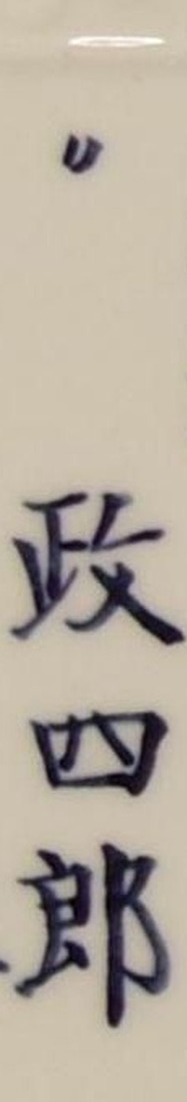政四郎
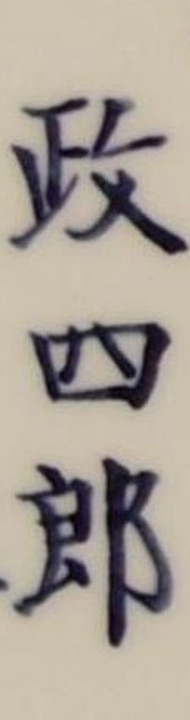政四郎
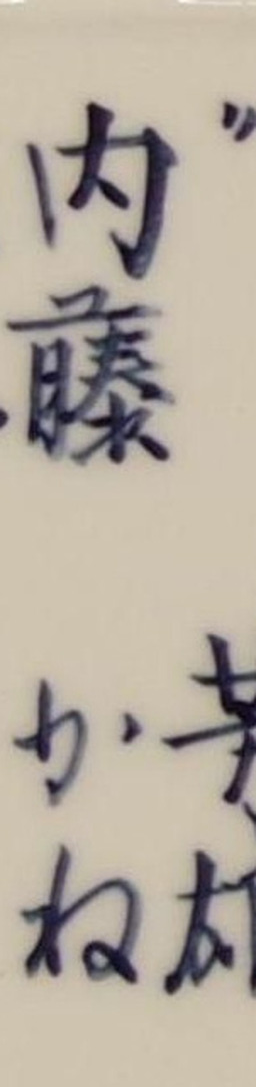内藤かね
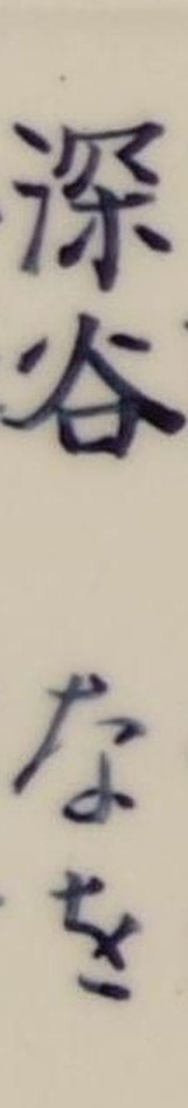深谷なを
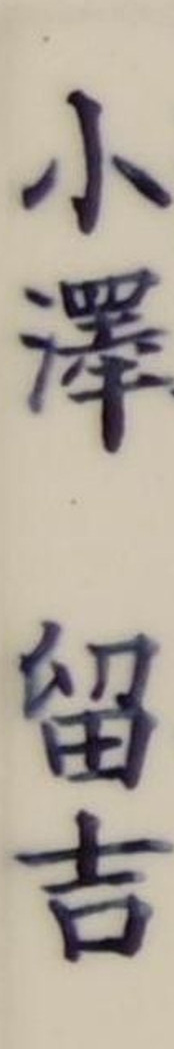小澤留吉
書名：E~L
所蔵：高野山金剛峯寺
